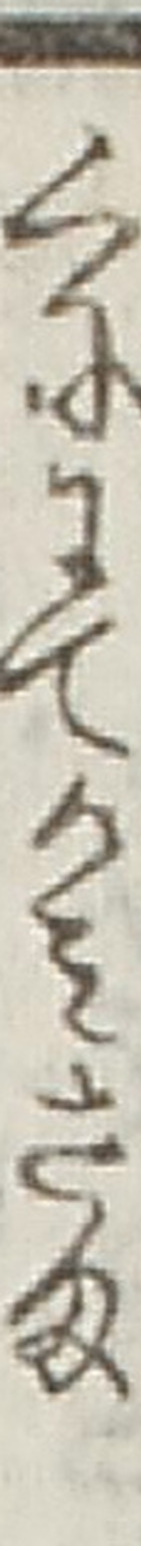くににてかみさま
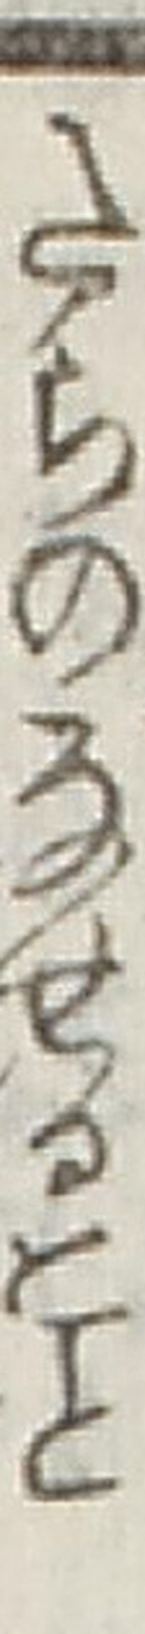たちのなせること
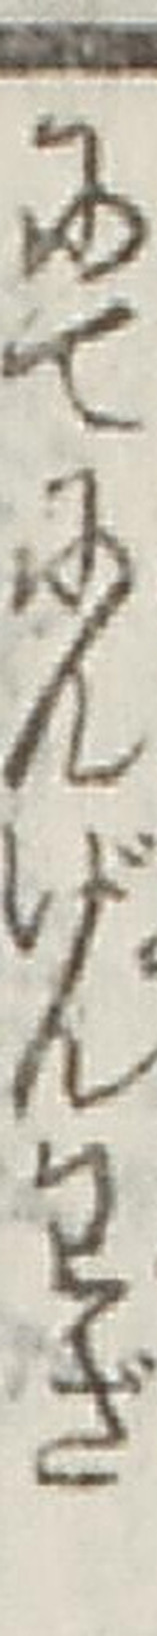にてにんげんわざ
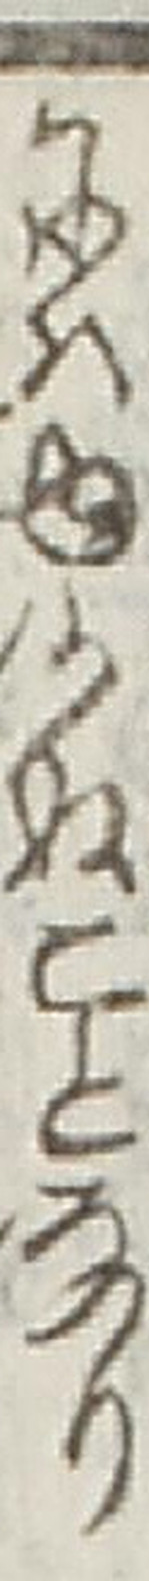にはゆかぬことなり
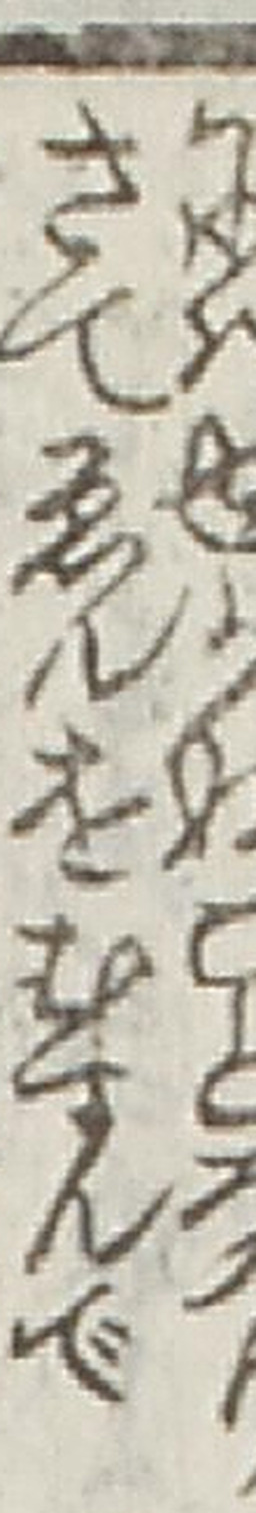さてえんをむすんで
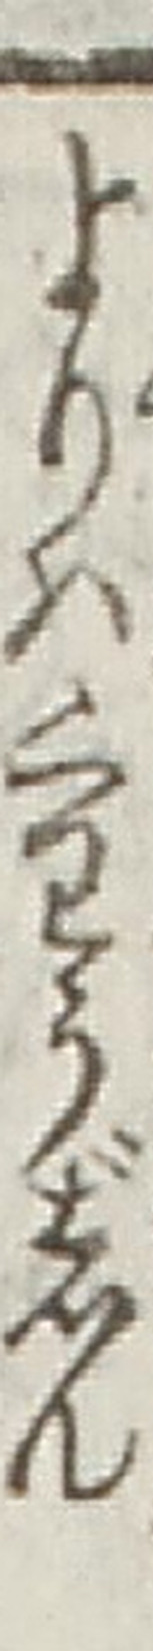よりはくわうじん
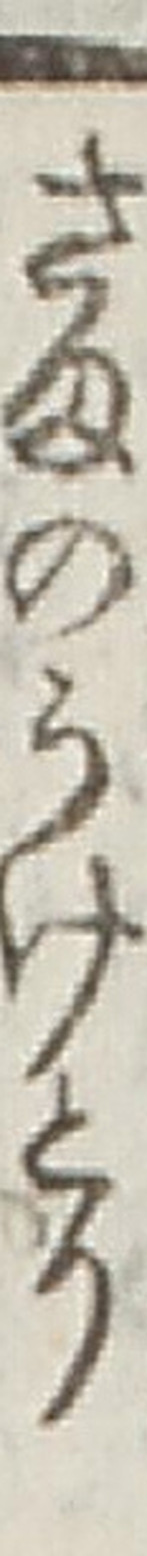さまのうけとり
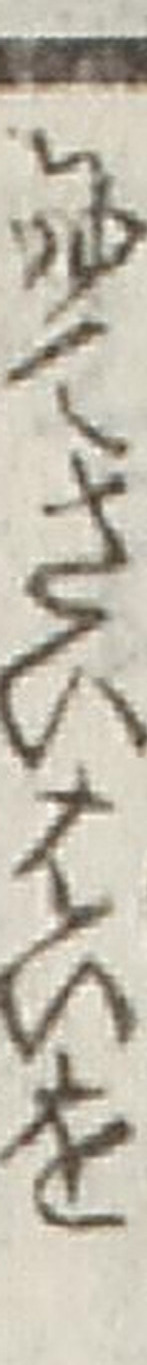にてさいはいを
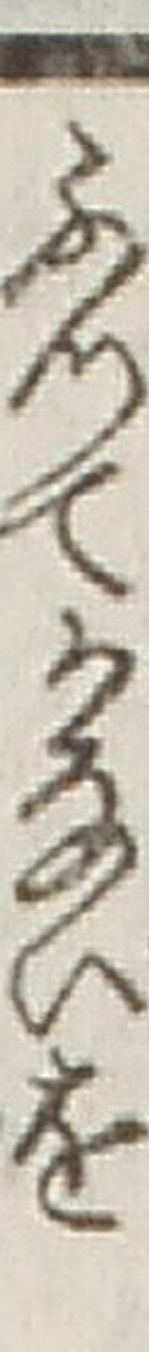ふつてかないを
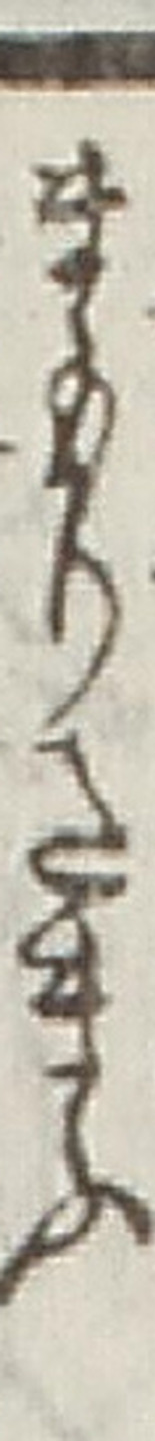まもりたまふ
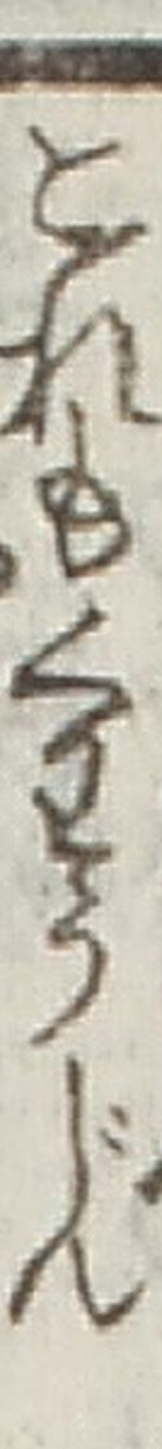これもくわうじん
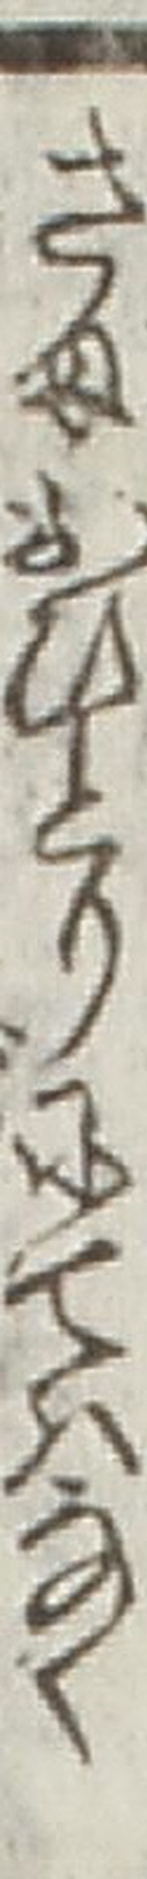さまおひとりにてハなく
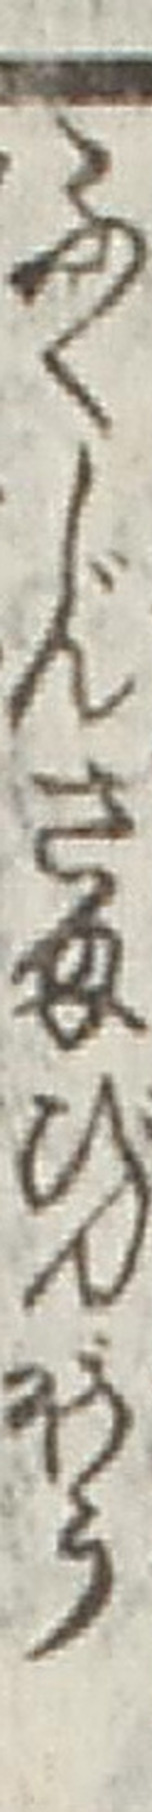ふくじんさまびんぼう
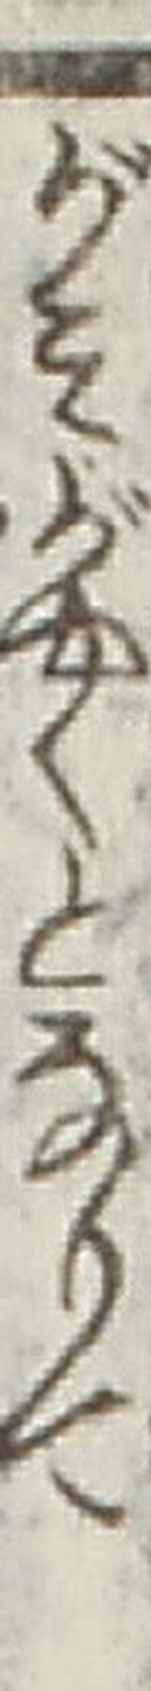がみがゆくとなりて
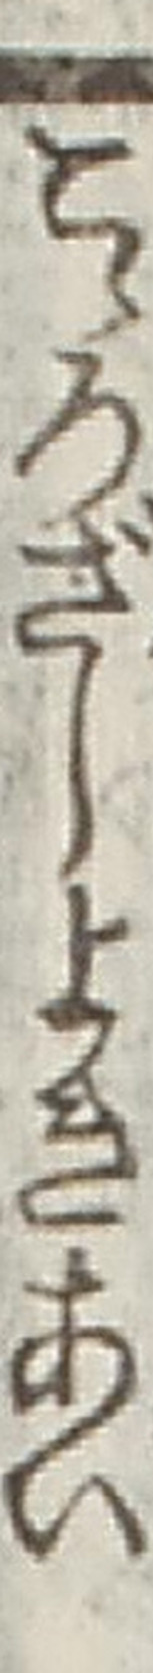こゝろざしよきあい
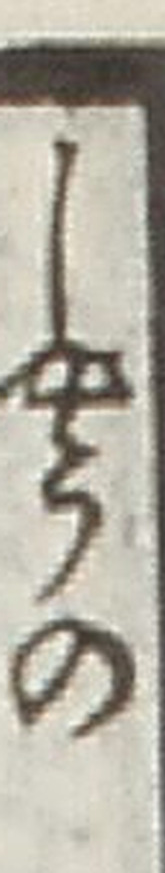しやうの
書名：三世相出雲當座帳　上下冊
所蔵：東京大学地震研究所図書室 Earthquake Research Institute Library, The University of Tokyo, JAPAN
